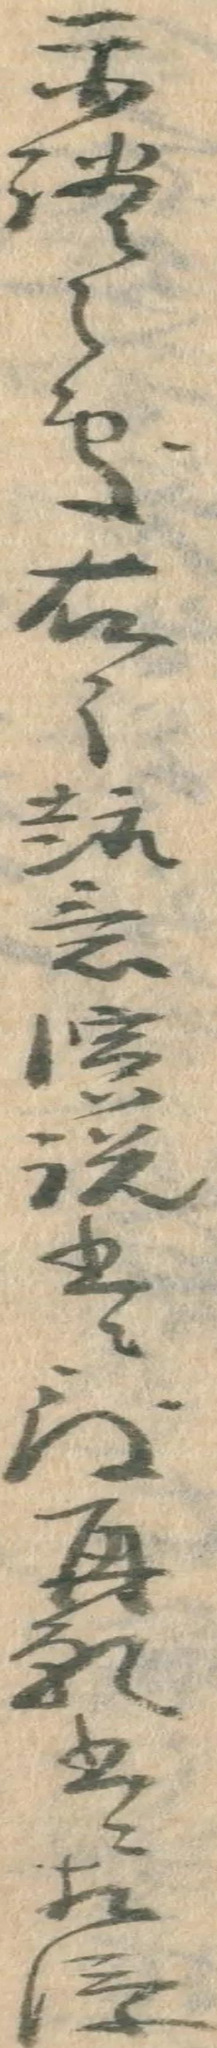示談之處、右之趣意演説書ニ致再願書ニ相添、
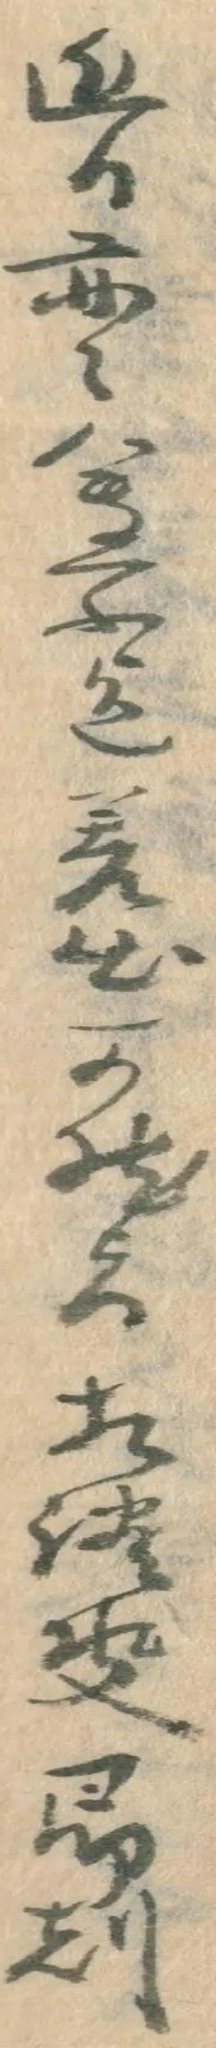近日亦々會所迄差出可然旨相談決、即刻

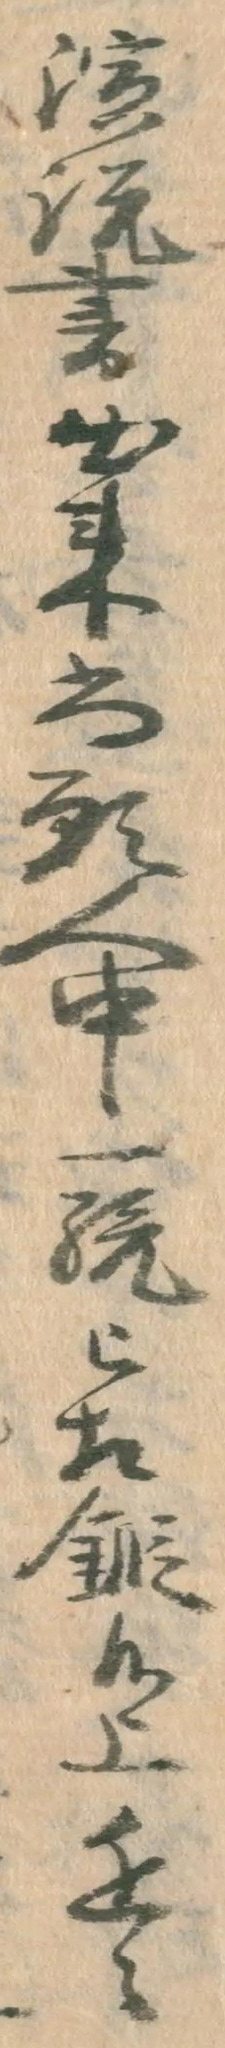演説書出来尚願人中一統被相候上、近々
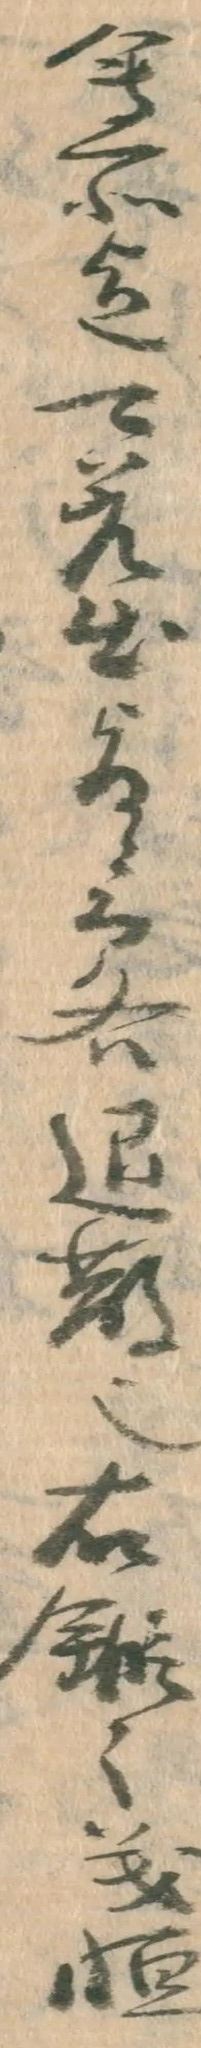會所迄可差出旨ニ而各退散也、右銘々義恒
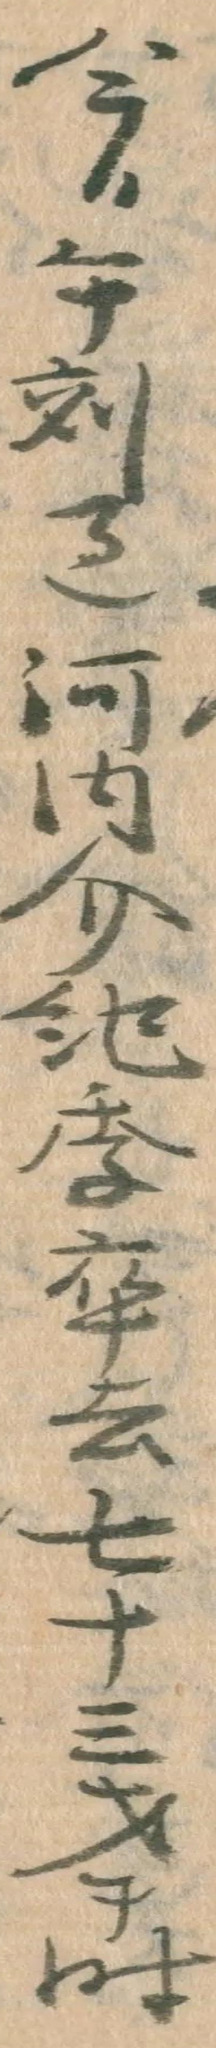今日午刻過、河内介紀季卒去、七十三才、于時
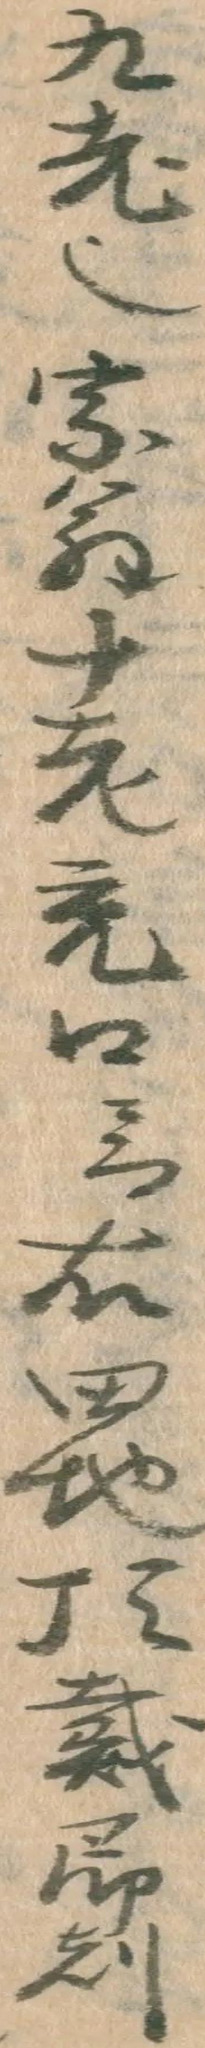九老也、家翁十老充口ニ而、右田地頂戴、即刻
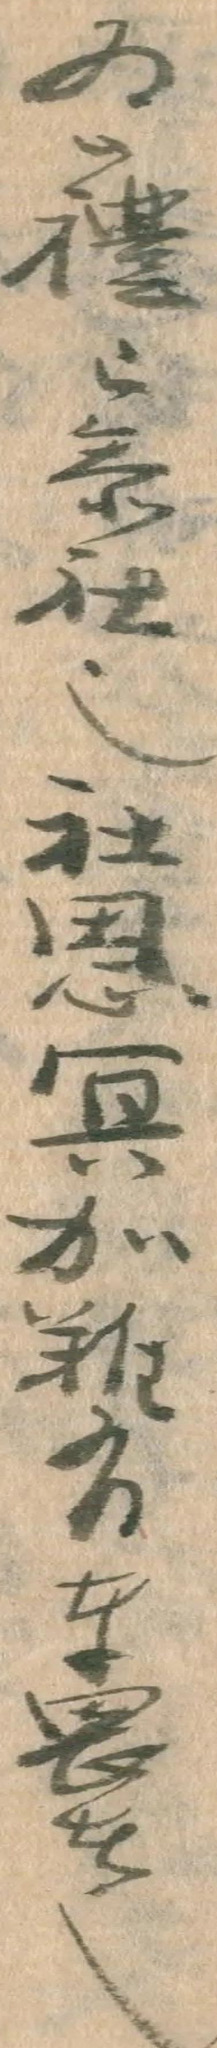為御礼被参社也、社恩冥加難有奉畏在也、
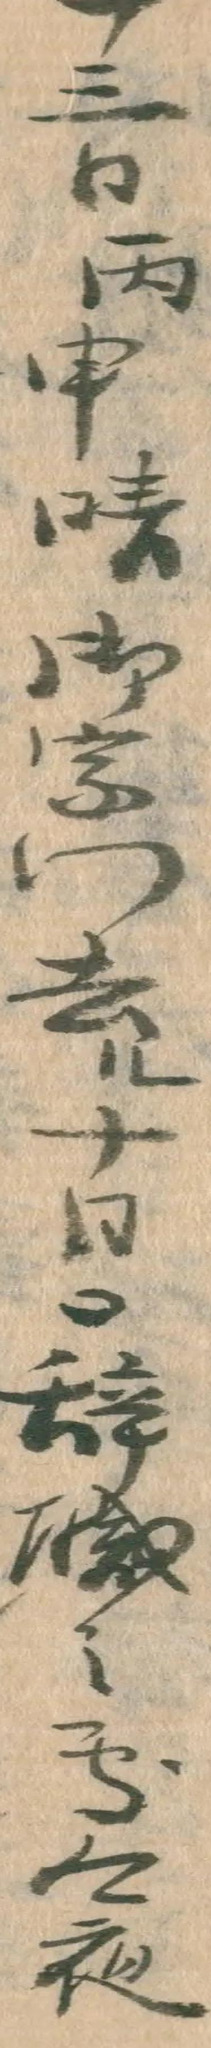十三日丙申晴、御家門去ル十日御辞職之處、今夜
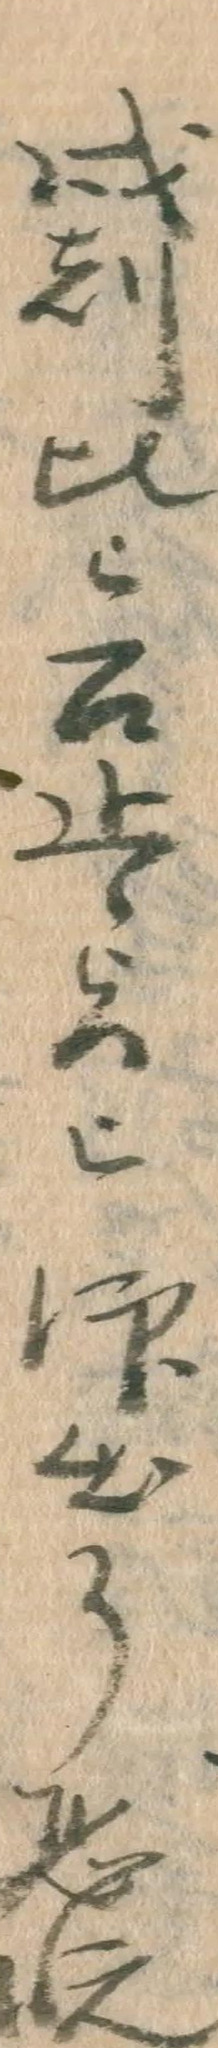戌刻頃被召止候旨被仰出了、恐悦、
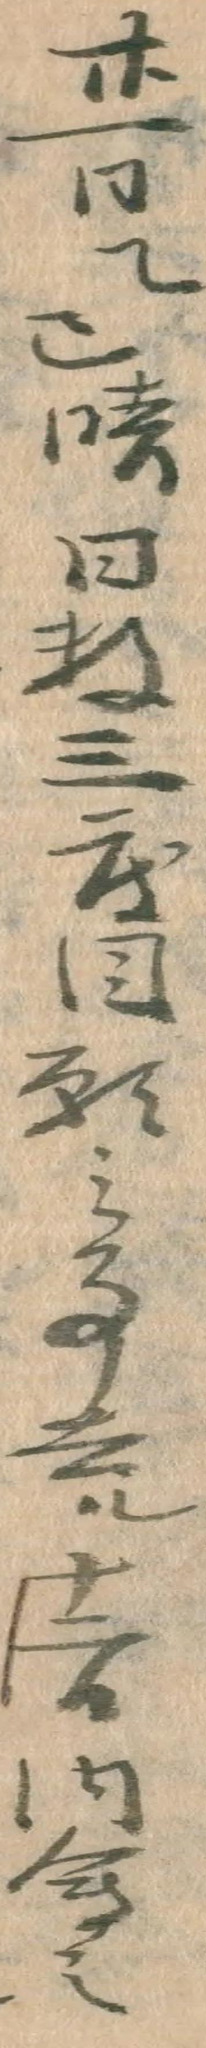廿一日乙巳晴、日数三度目願之事、去ル十二日内會之
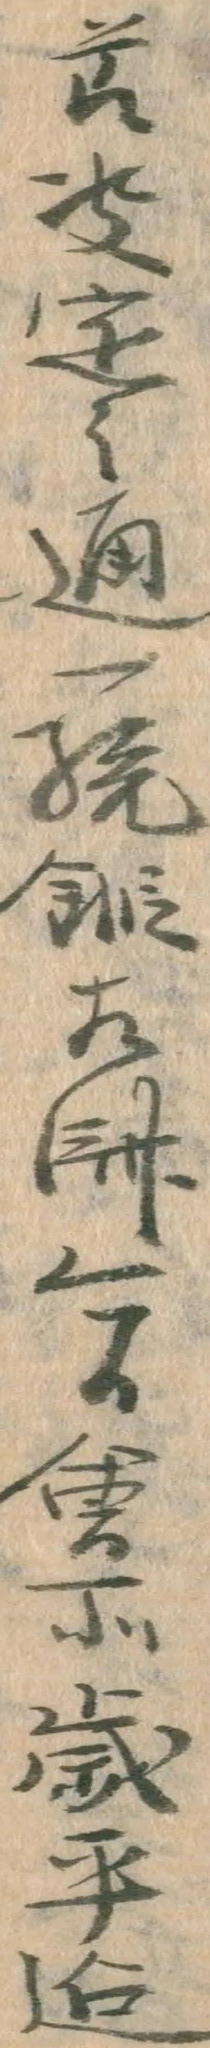節決定之通一統鍛相済、今日會所歳平迄
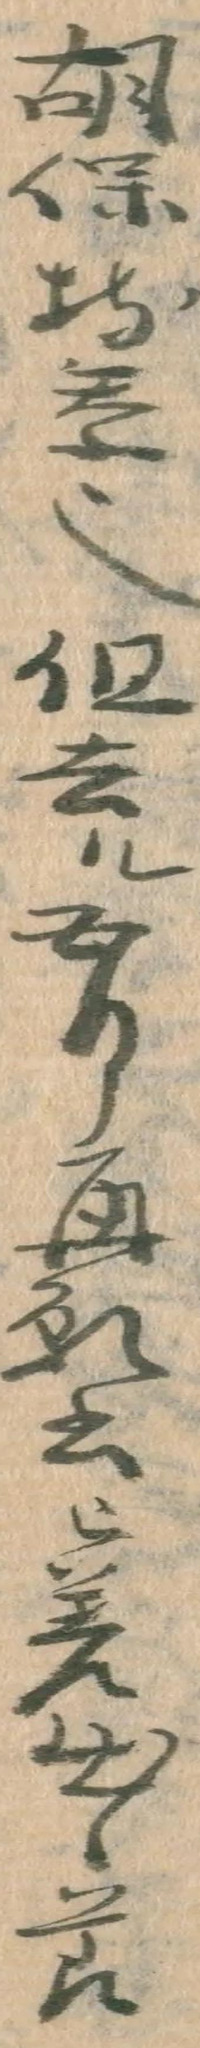胡保持参也、但去ル五月再願書被差出候節
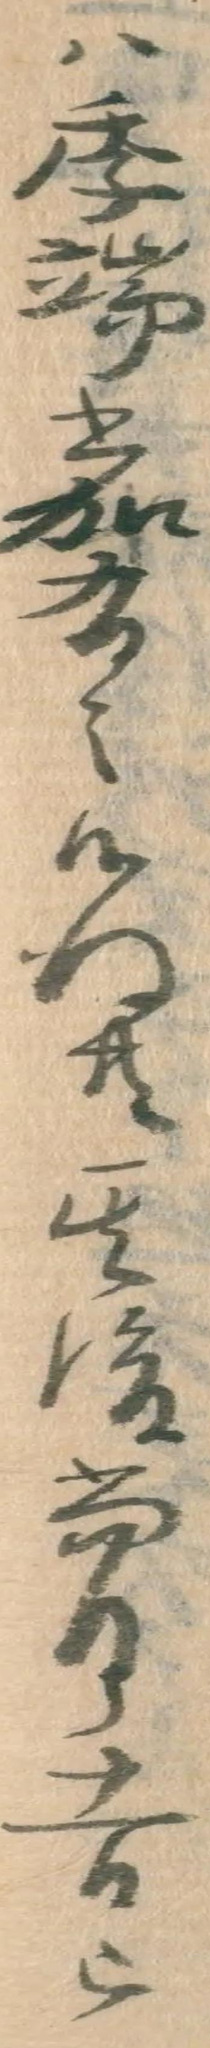ハ、季端書加有之候得共、其後當月十一日被
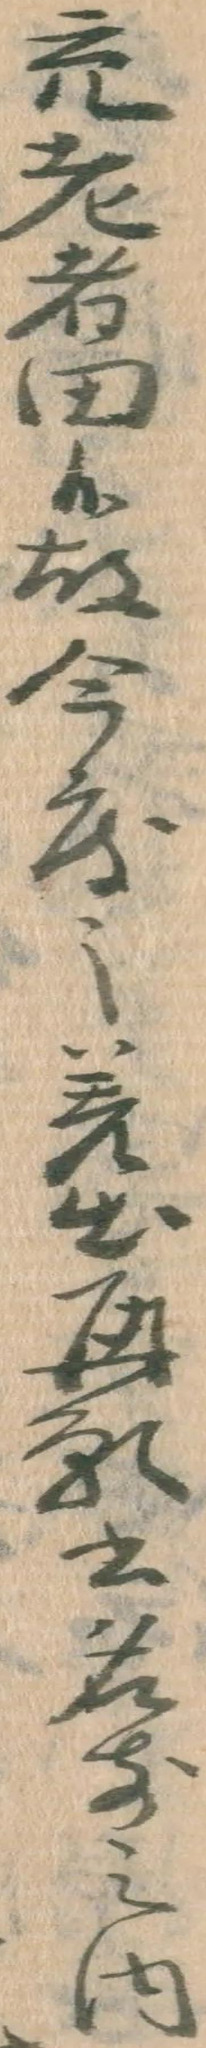充老者田候故、今度之差出再願書名前之内
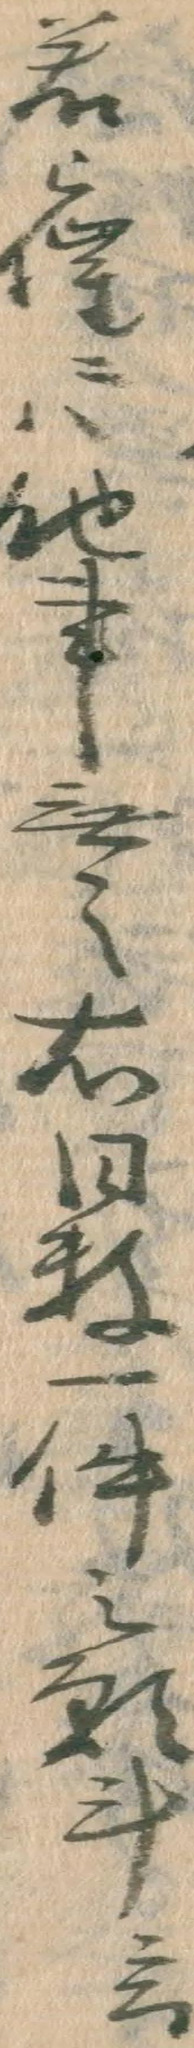若被催ニハ他事無之、右日数一件之願計ニて
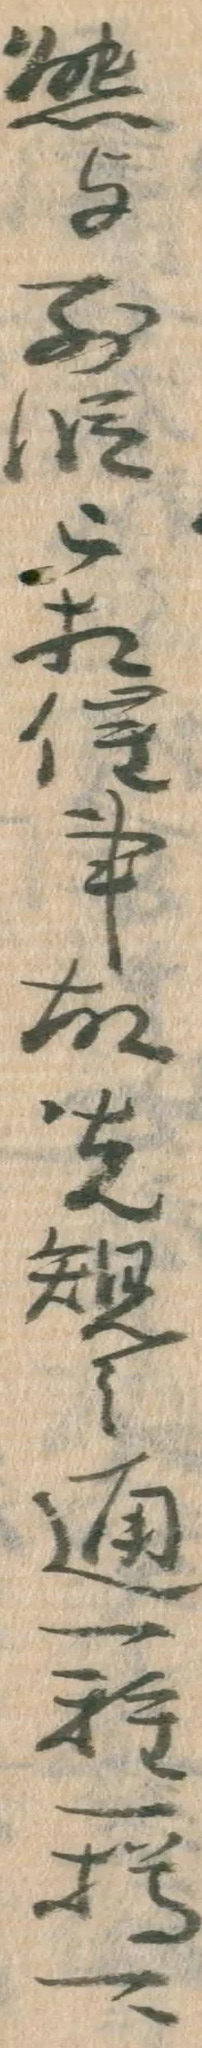然と別段被相催事故、先規之通一種一樽可
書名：賀茂社記録. 第63冊
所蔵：国立国会図書館 National Diet Library, JAPAN
